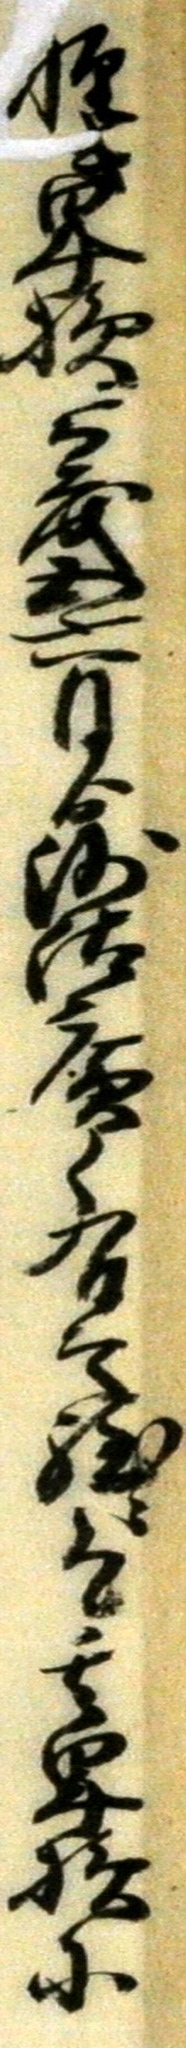軽キ旱損ニ而茂五六月ゟ沙汰広く有之程候ハヽ其旱損に
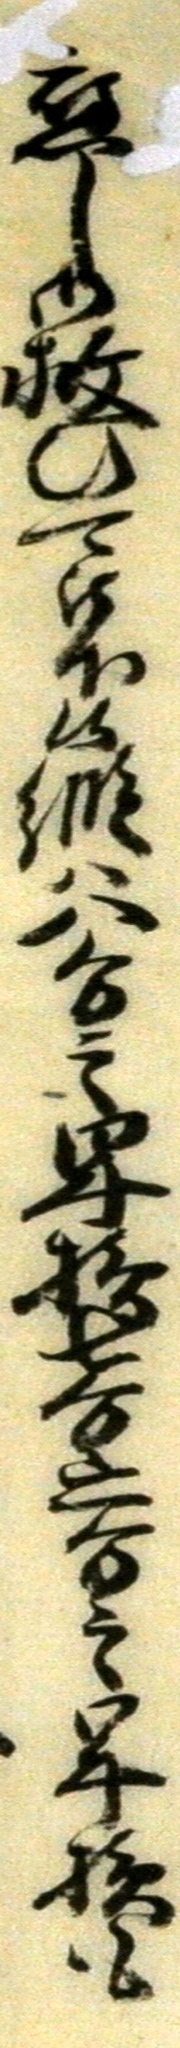応し御救ひ可被下候縦ハ八分之旱損七分六分之旱損も
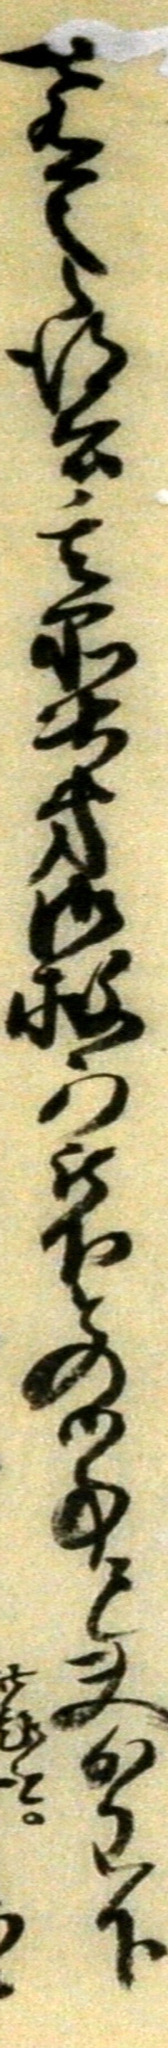可有之候得者其品次第御救可被下との御事ニ候夫ゟ已下
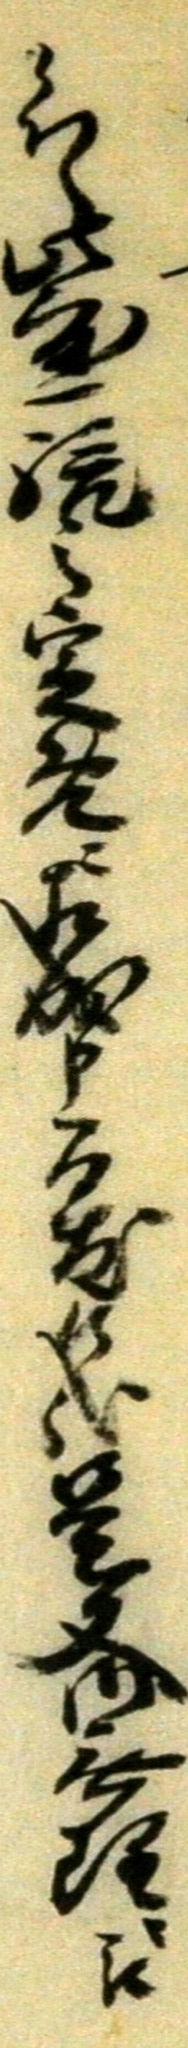候ハヽ此度一統之定免ニ相成申間敷候哉是又御無理ニ被
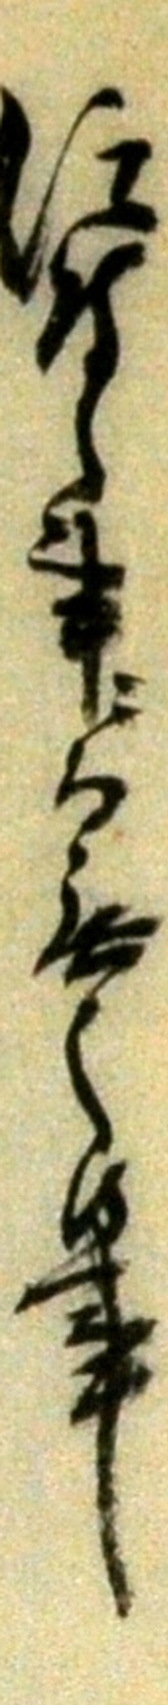仰付候事ニ而無之候事
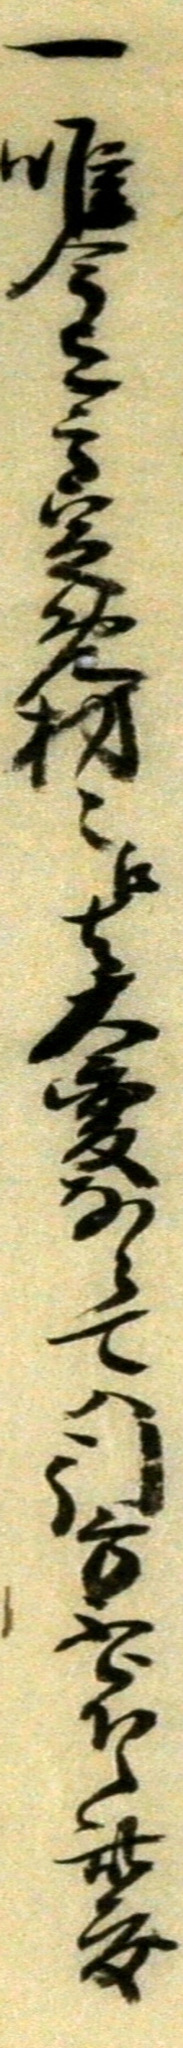一唯今迄之定免村々江者大変ならてハ引方不被下候此度
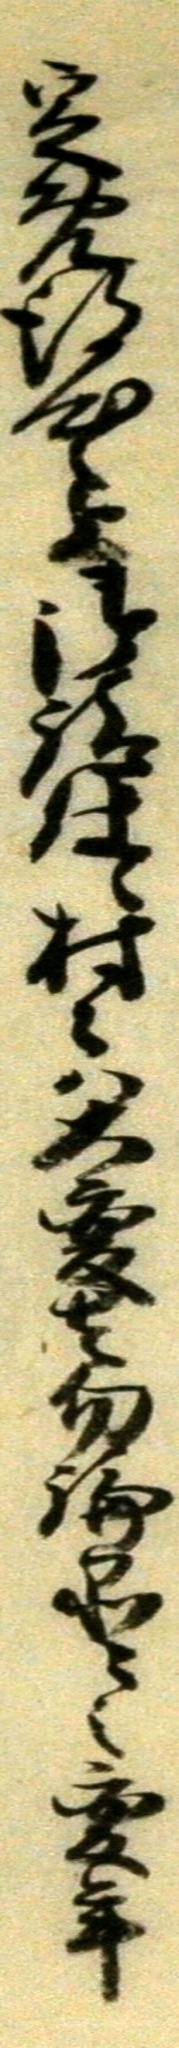定免得心ニ而御請仕候村々ハ大変者勿論品々之変年
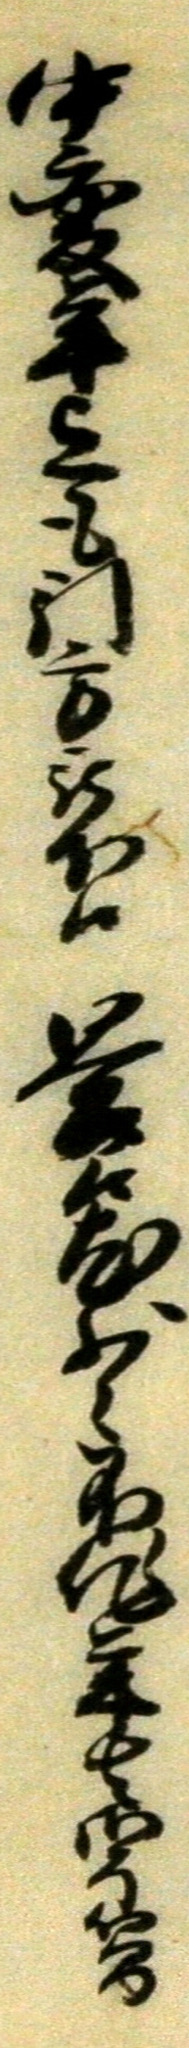中変年迄も引方被下候思召候尤少々不作年者御了簡
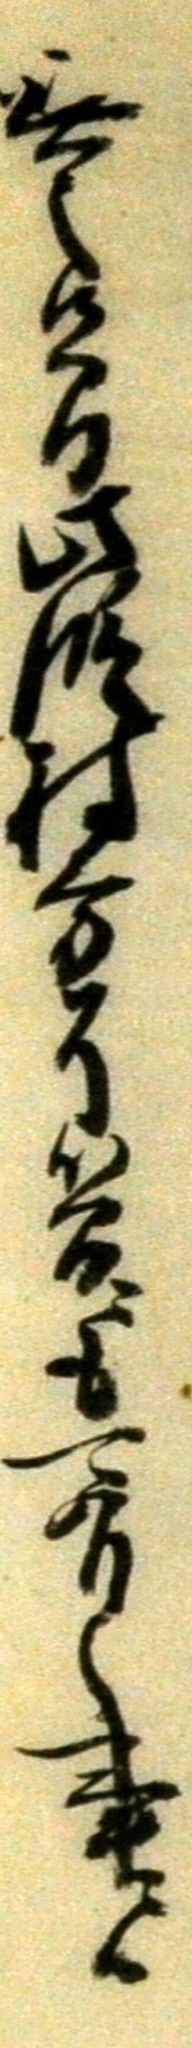無之候間此段村方了簡ニも可有之事ニ候
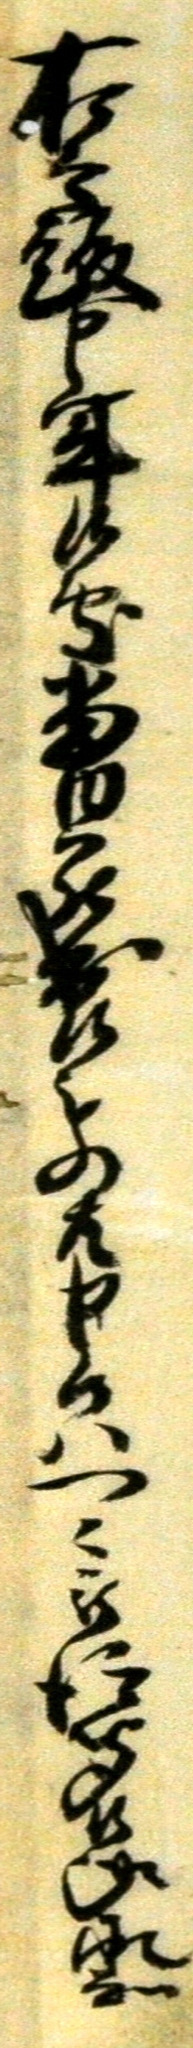右之趣申聞候処当日罷出候もの共申候ハ一々被仰聞候趣承知

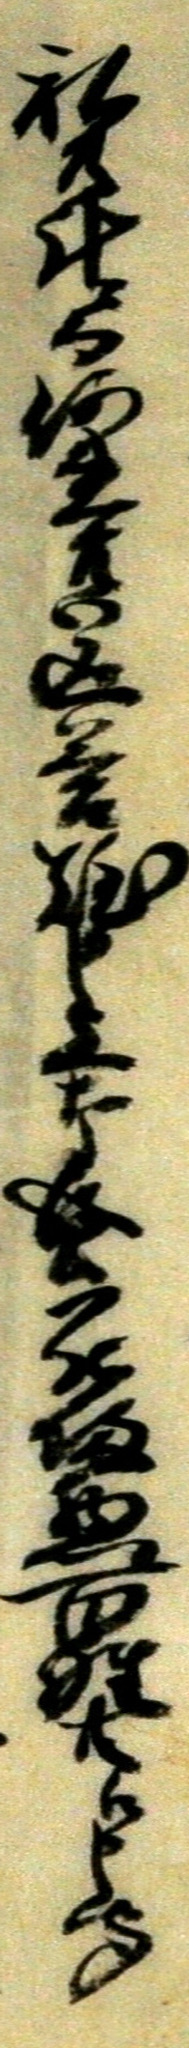私共斗ニ而何れ共御返答難申上奉存候罷帰惣百姓共江申聞
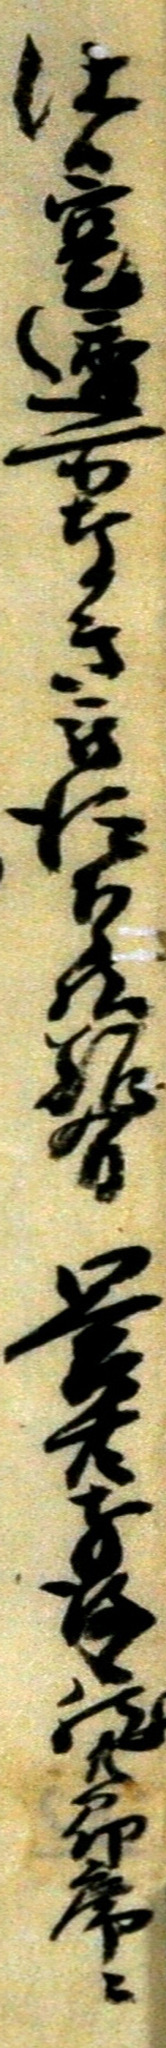仕候寔違所なき被仰下候様難有思召共奉存候然共即席ニ
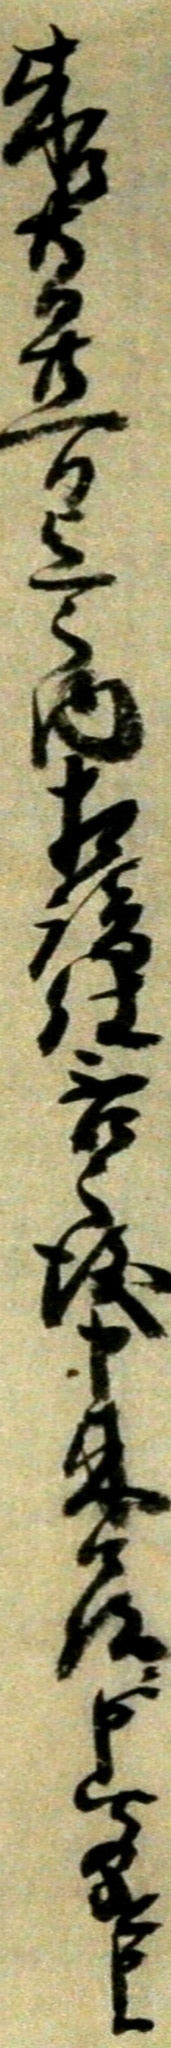来ル廿日廿一日迄之内相談仕否之儀申来候様ニ申聞遣申候
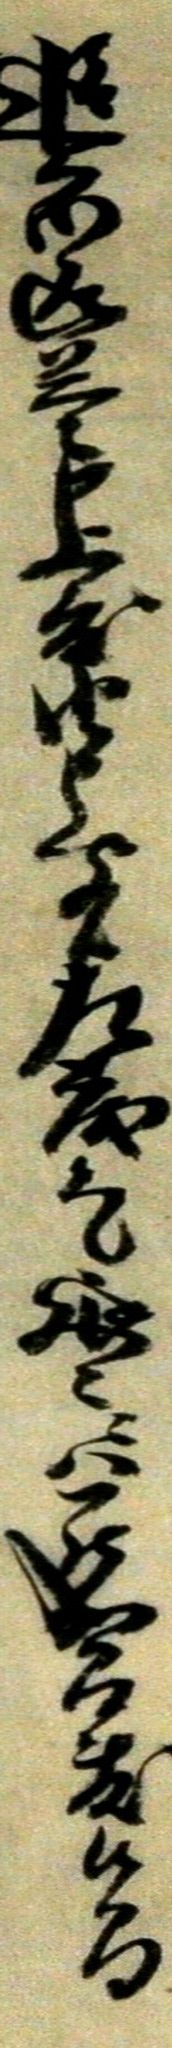追而御返答申上度由申聞候左茂候ハヽ延々ニハ罷成間敷候間
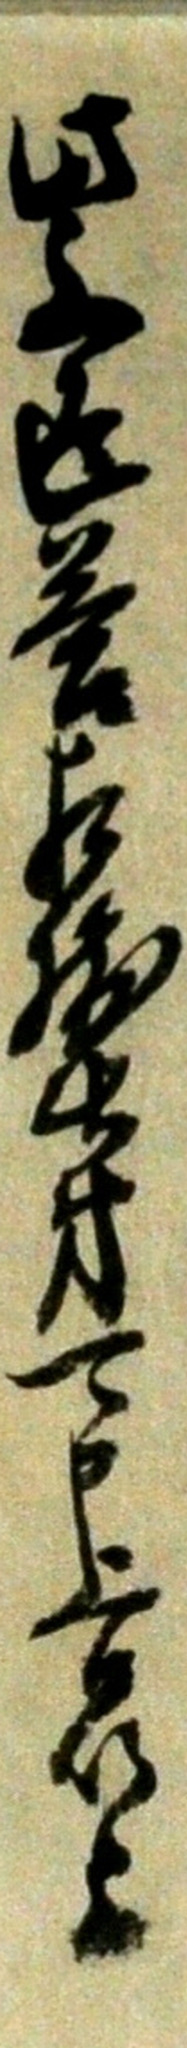此上返答相勝次第可申上候以上
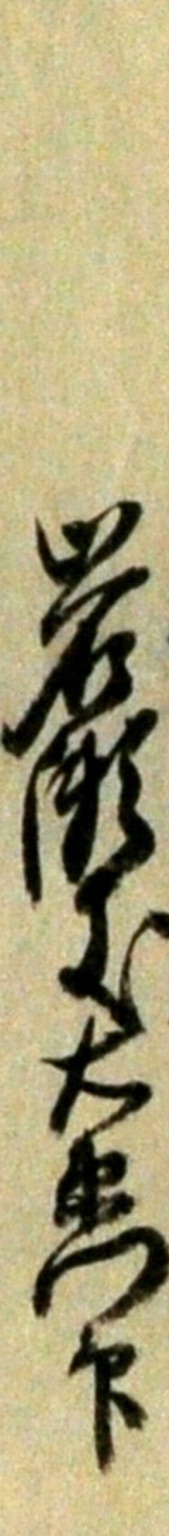岩瀬丈右衛門印
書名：留書
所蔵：伊那市立高遠町図書館・合同会社AMANE
